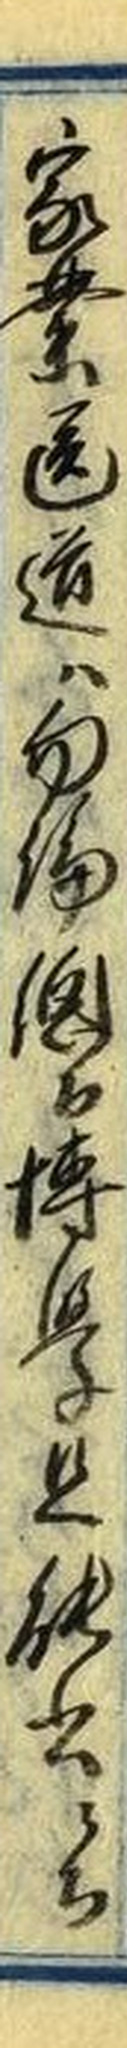家業医道は勿論側而博学且能書に而
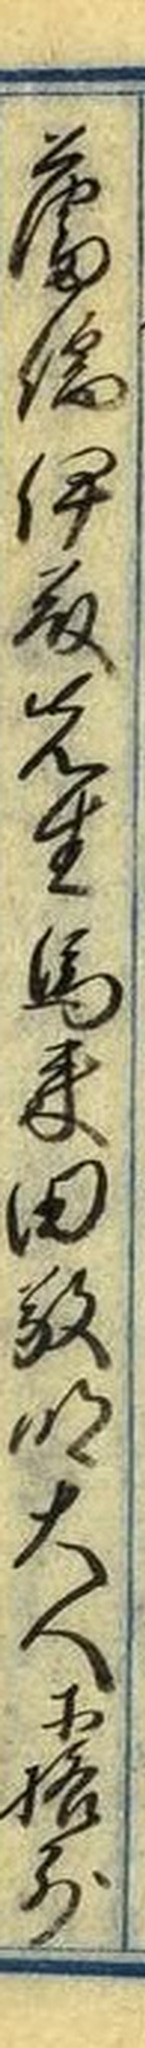藩儒伊藤先生馬来田敬明大人等格別
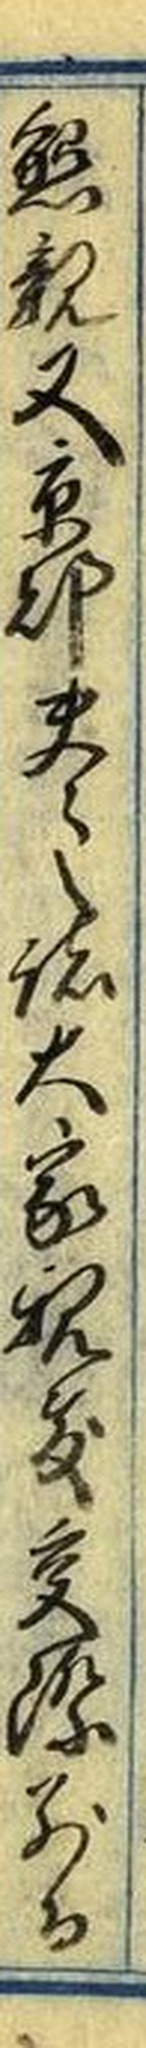懇親又京都夫々之諸大家親敷交際別而
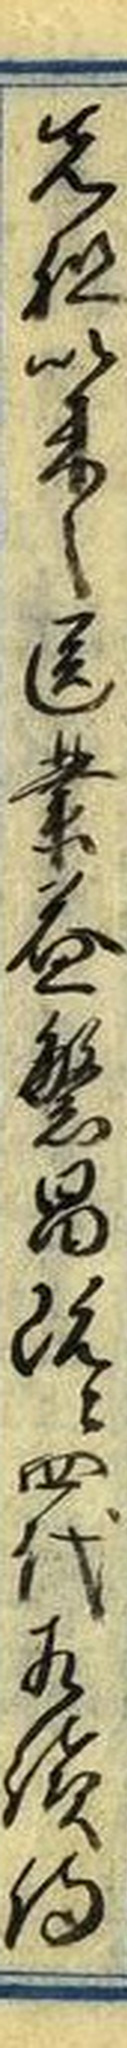先祖以来之医業益繁昌既に四代相続侍
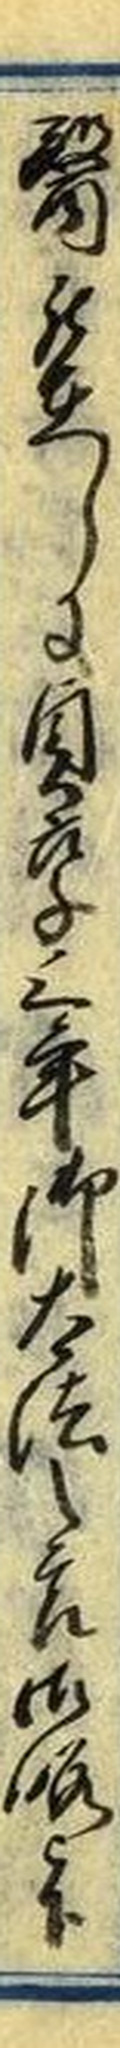医罷在しに貞享三年御太法之節御暇被下
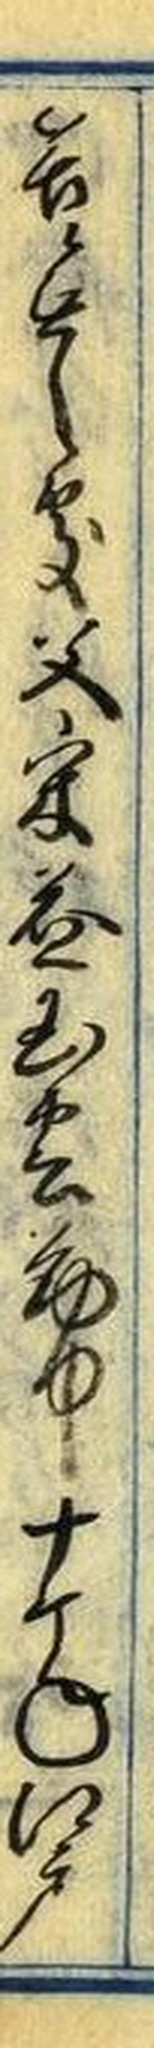筈に無之処父宗益玉雲勤中十ヶ年江戸
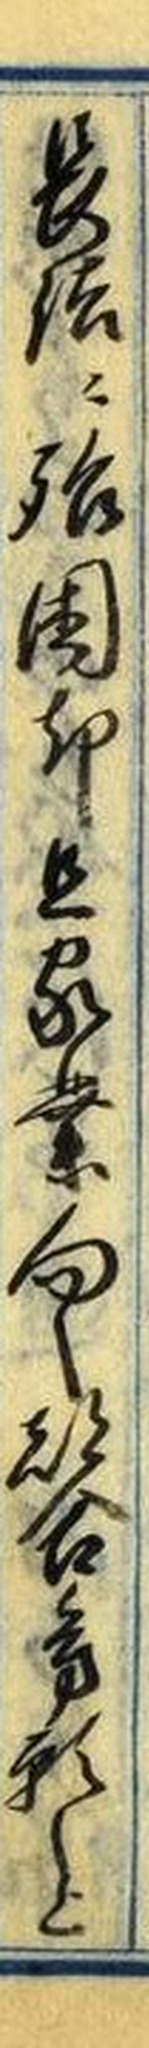長詰に殆困却且家業向之都合旁願之上

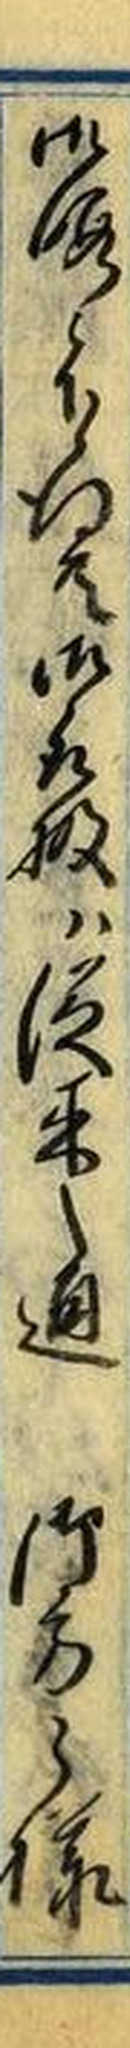御暇被下候得共御取扱は従来之通御方々様
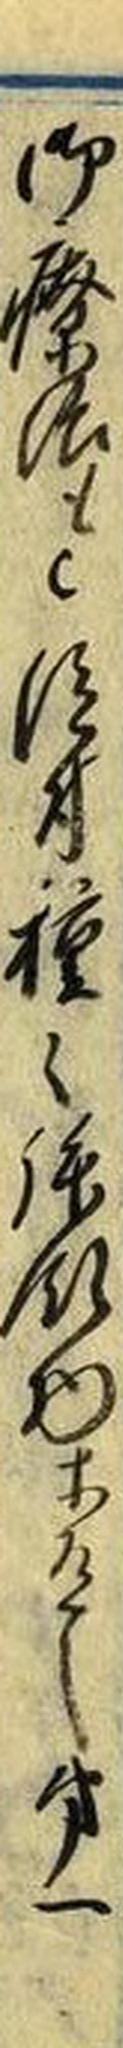御療治も被仰付種々之拝領物等有之第一
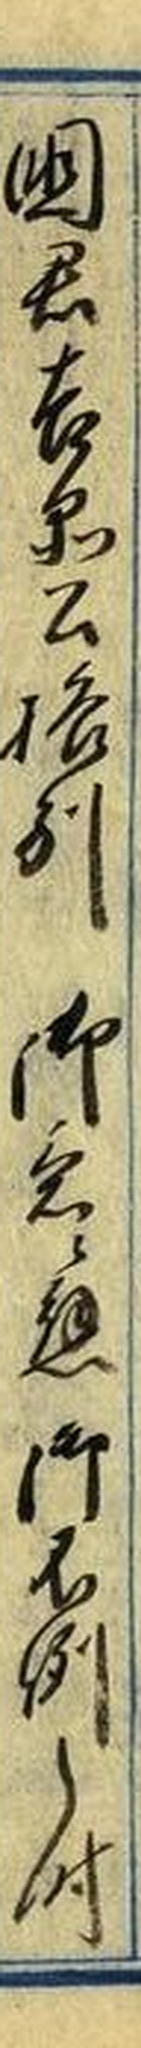国君吉品公格別御意に懸御不例之時
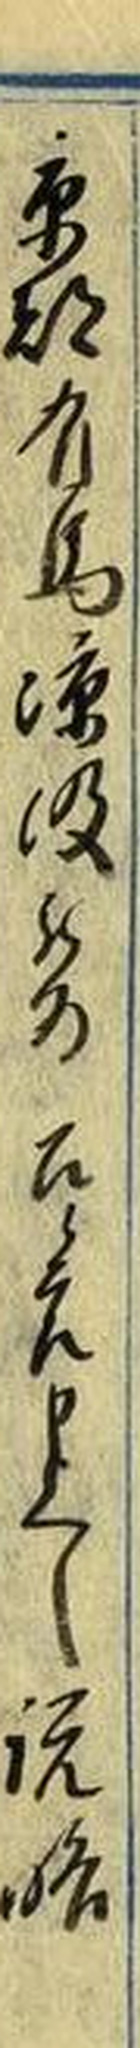京都有馬涼汲被為召之節申上之説略
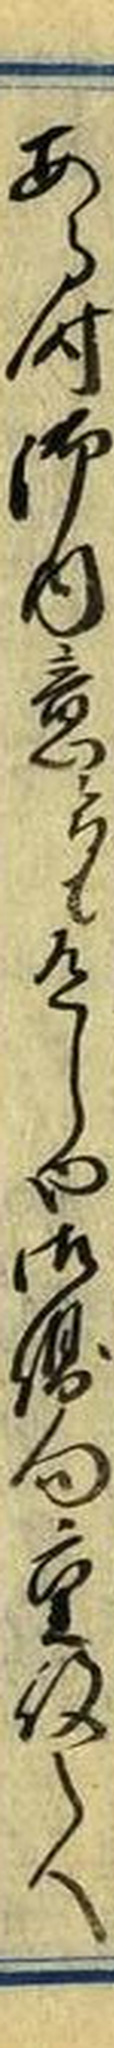ある時御内意に而も有しや御側向重役之人
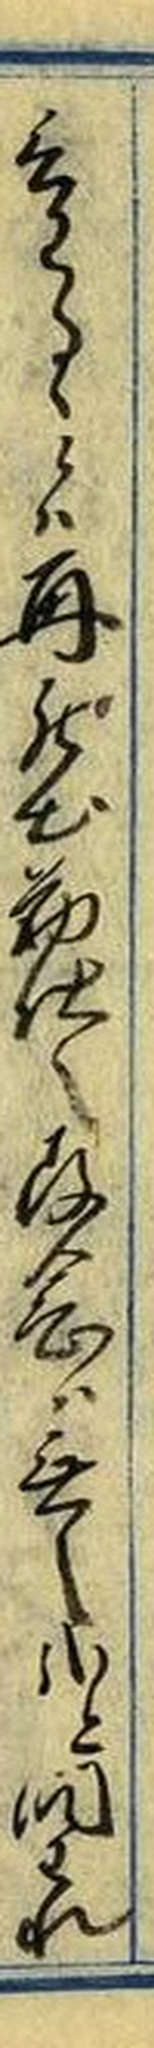言わるゝには再罷出勤仕之存念は無之哉と問われ
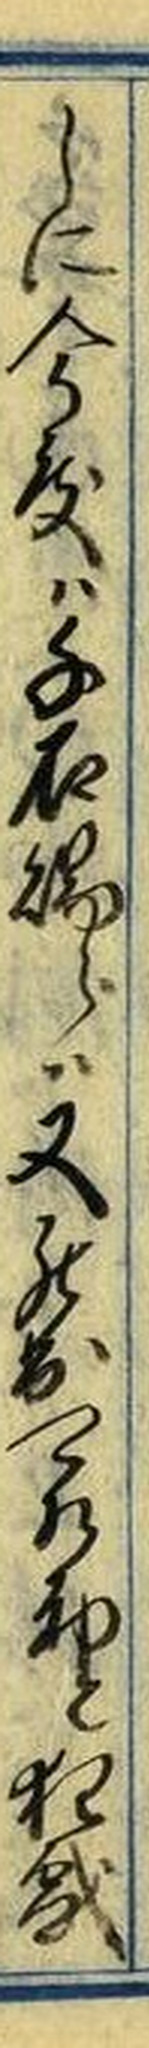しに今度は千石賜らは又罷出可取勤と狂戯
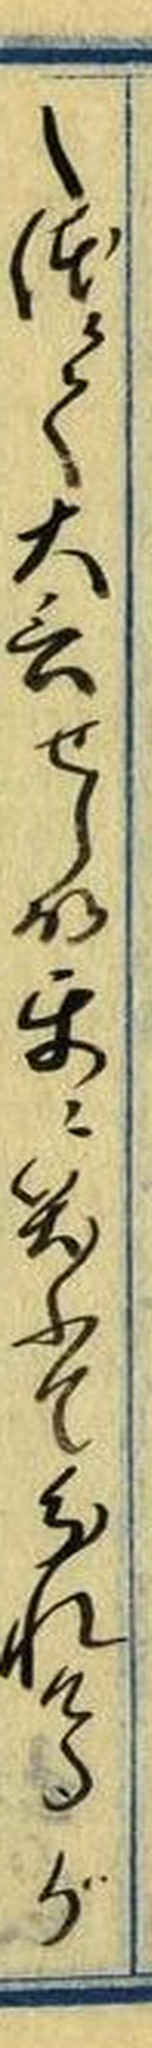之体にて大言せし故互に笑ふて分れけるが
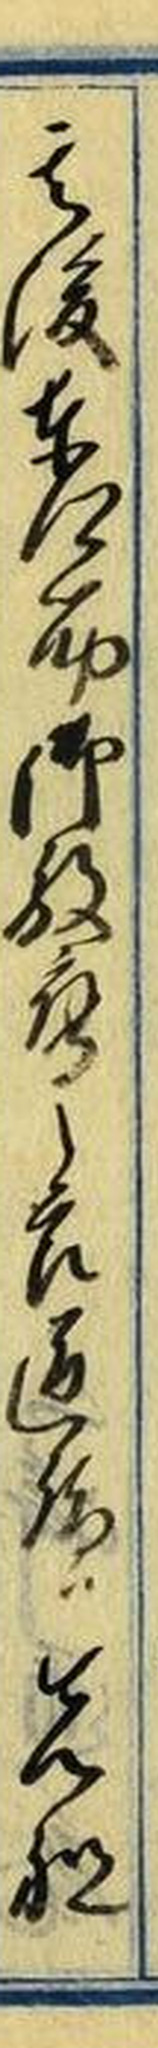其後東郷筋御放鷹之節道庵は先祖
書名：温古集 四巻
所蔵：福井県文書館 Fukui Prefectural Archives
